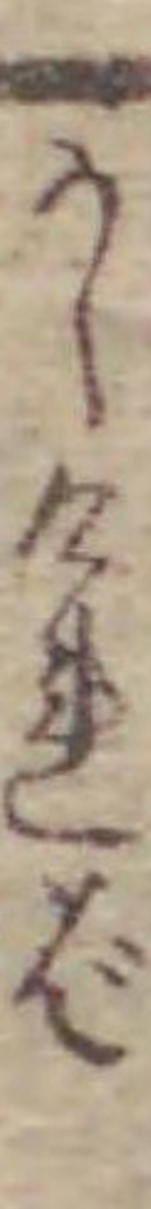かしければ
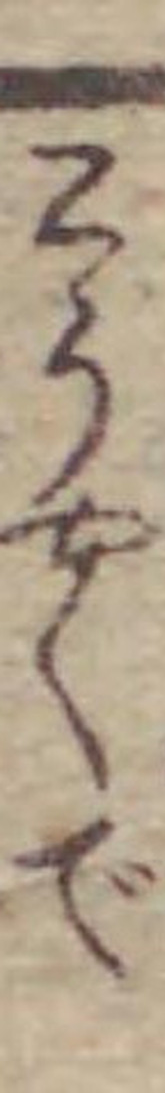こうやくで
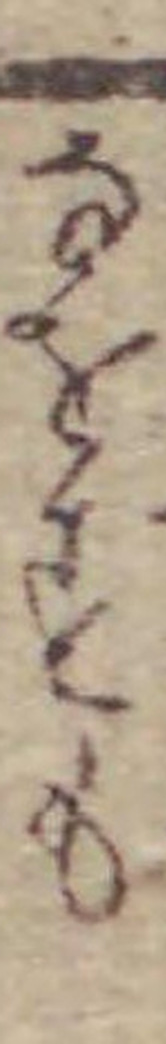なをすも
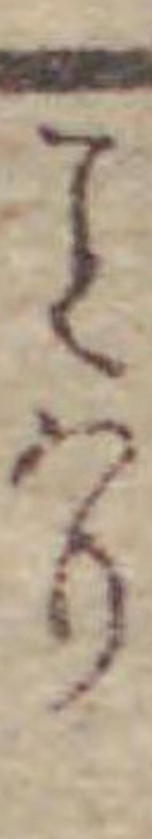ことはり
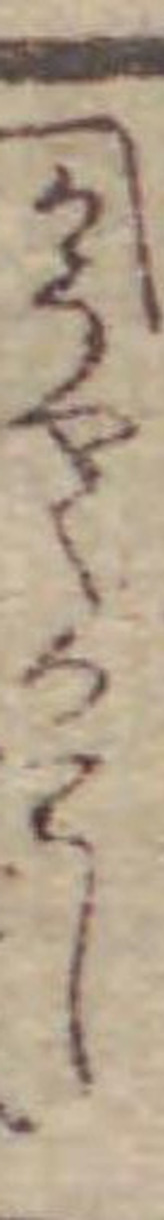〽かうやくかこし
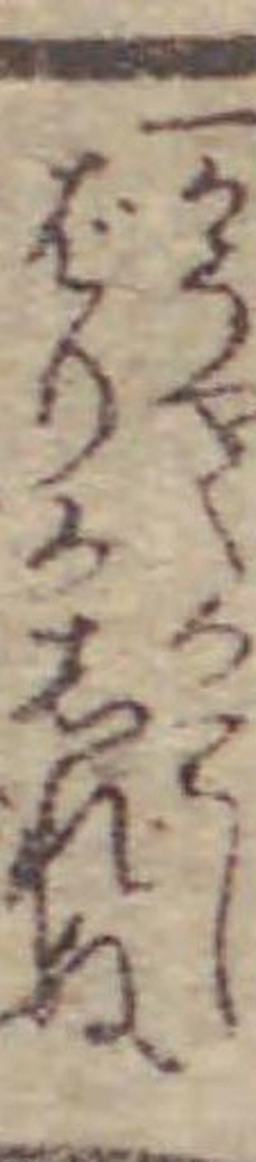ばりかしれぬ
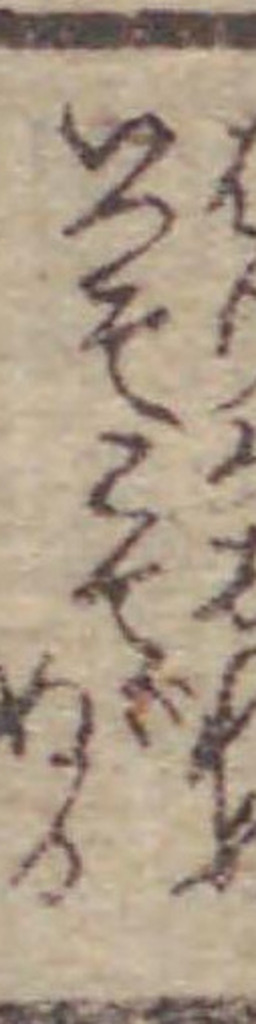いつそこてゞぬる
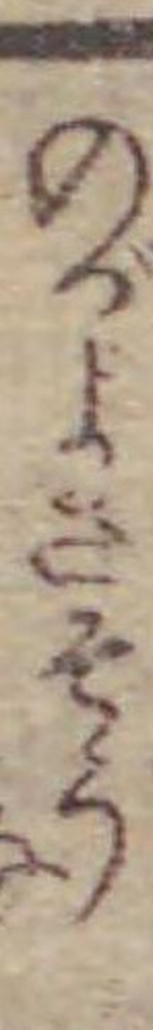のがよさそう
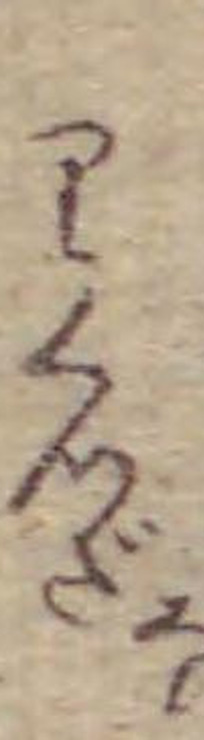りくつだ

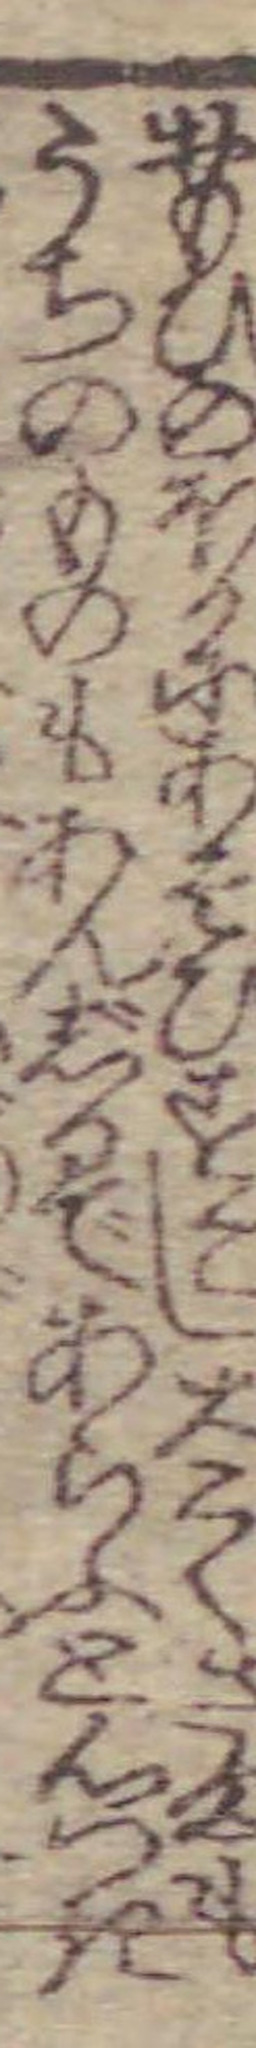うちのものもあんじるであらふと心つき
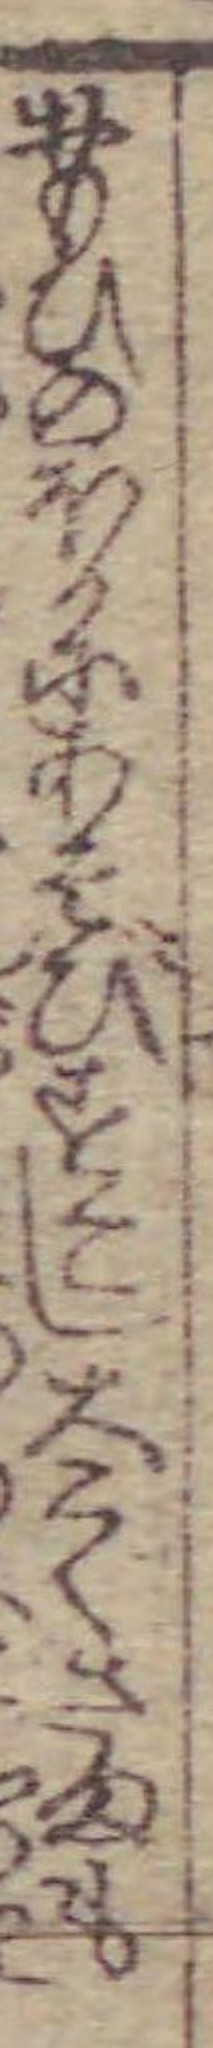おもひのほかにあそびすこし大こくさまも
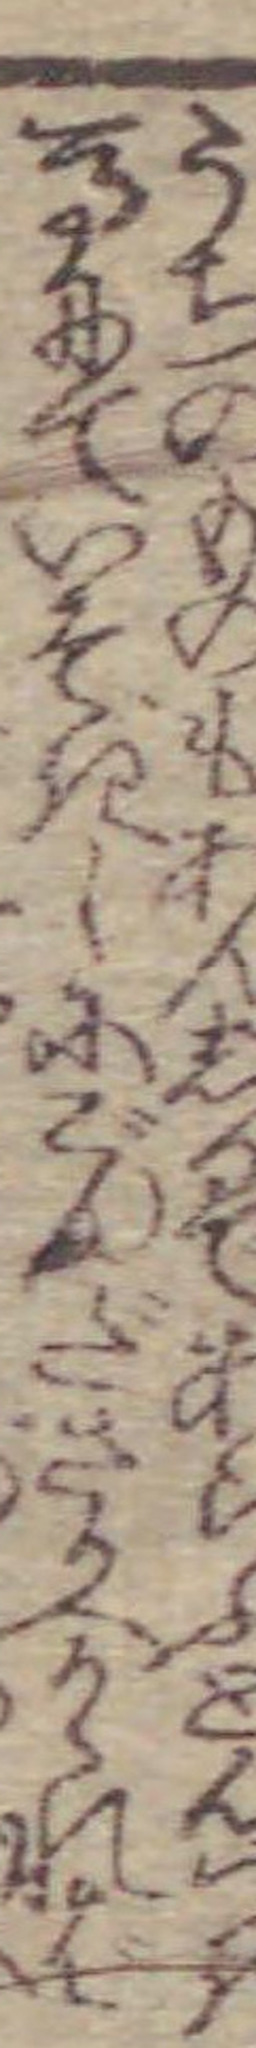馬にていそきしに〔ごんださか〕へかゝれは
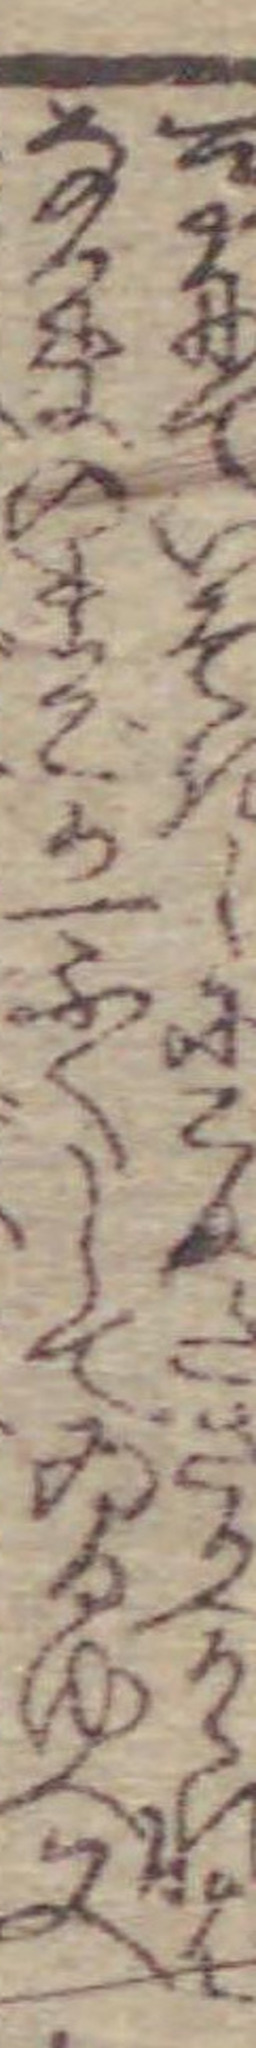なかまのまごか一ふくしてゐるゆへ又
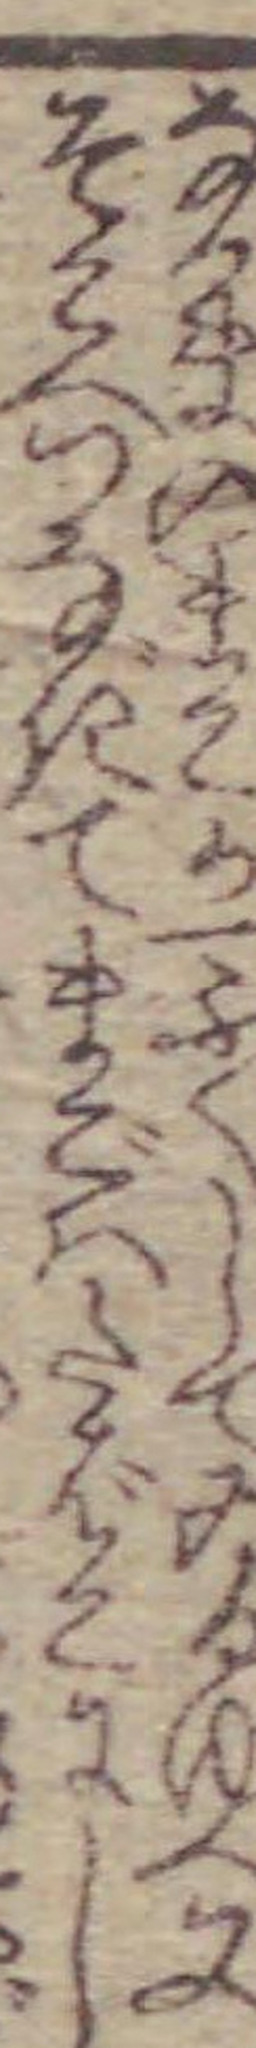そこへつなぎてまごはたばこにし
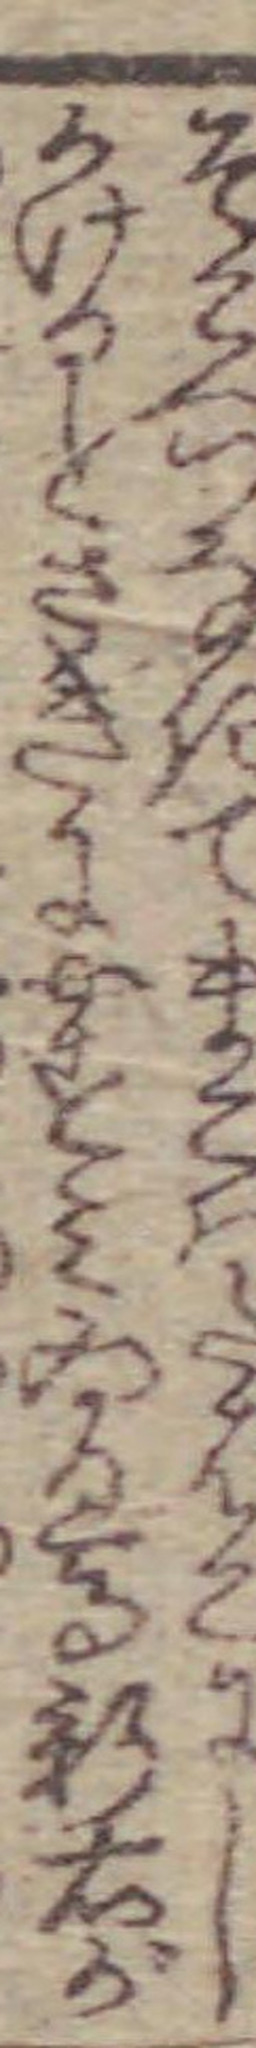かけるとさきにやすみゐる馬新右が
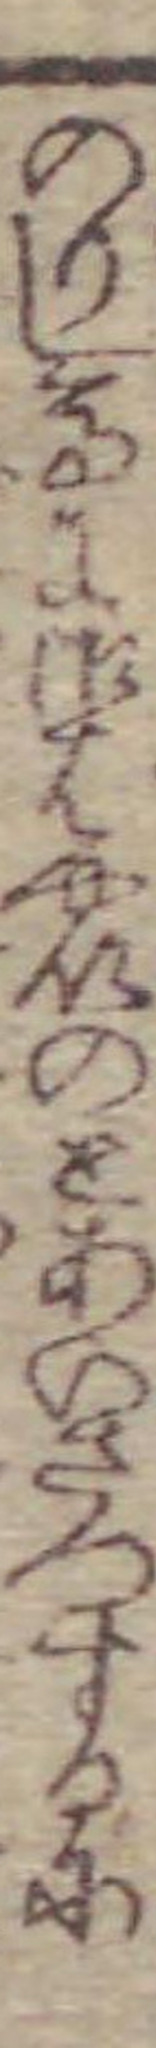のりし馬に御はやいのとあいさつするに
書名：即席耳学問 : 3巻
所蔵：国立国会図書館 National Diet Library, JAPAN
